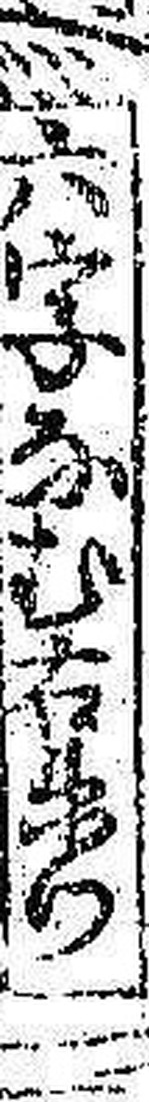六字子なむ右衛門

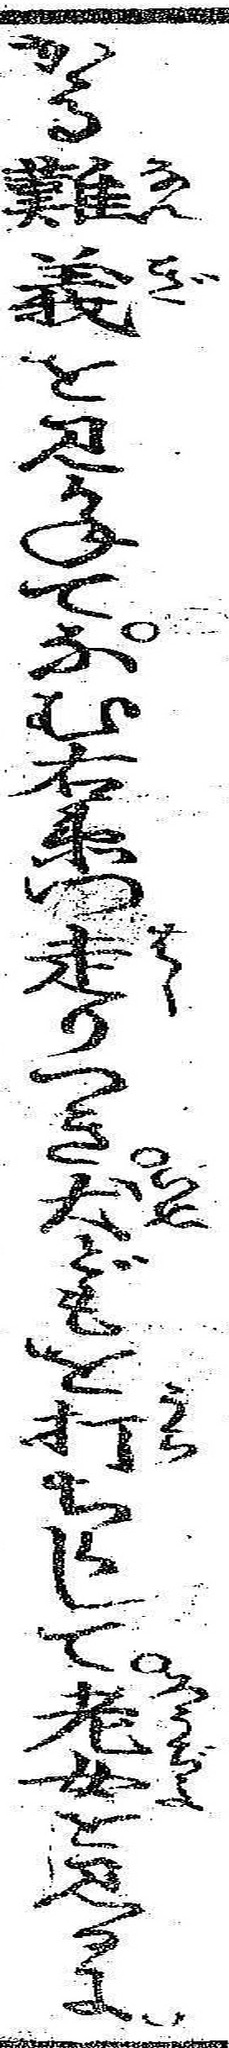かゝる難義を見かねて。なむ右衛門走りつき。犬どもを打ちらして。老女を見るに。
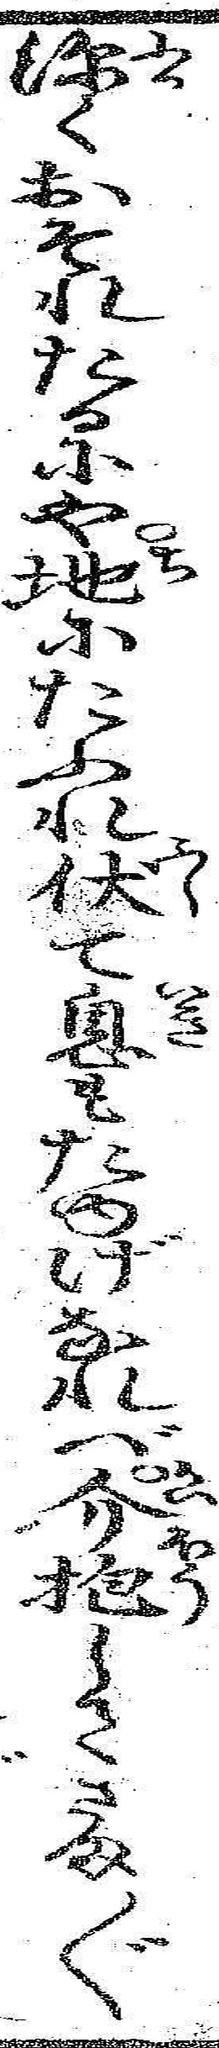深くおそれたるにや。地にたふれ伏て息もたゆげなれば。介抱してさま〴〵
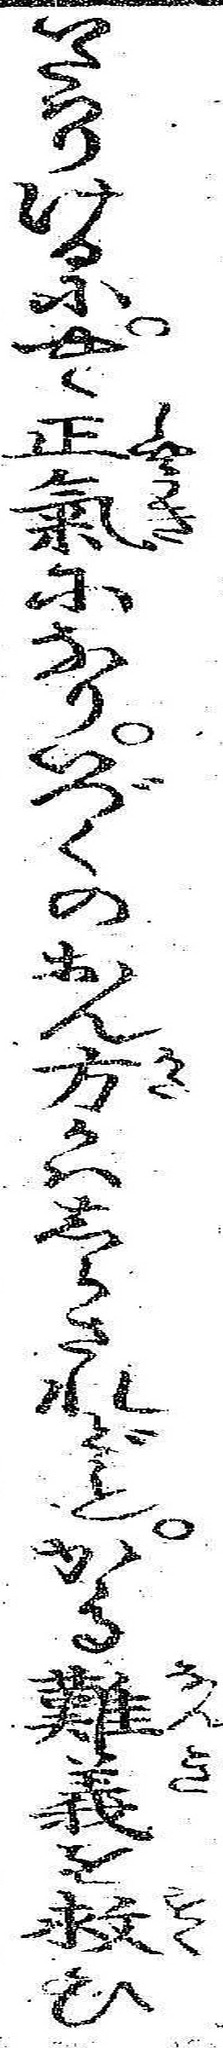いたはりけるに。やゝ正気になり。いづくのおん方かはしらされども。かゝる難義を救ひ
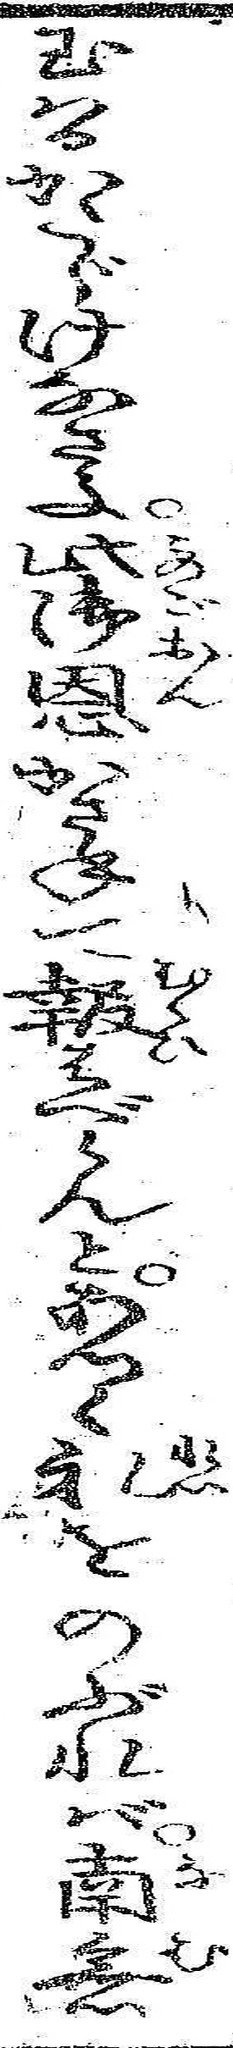玉はるかたじけなさよ。此御恩かさねて報はべらんと。あつく礼をのぶれば。南無
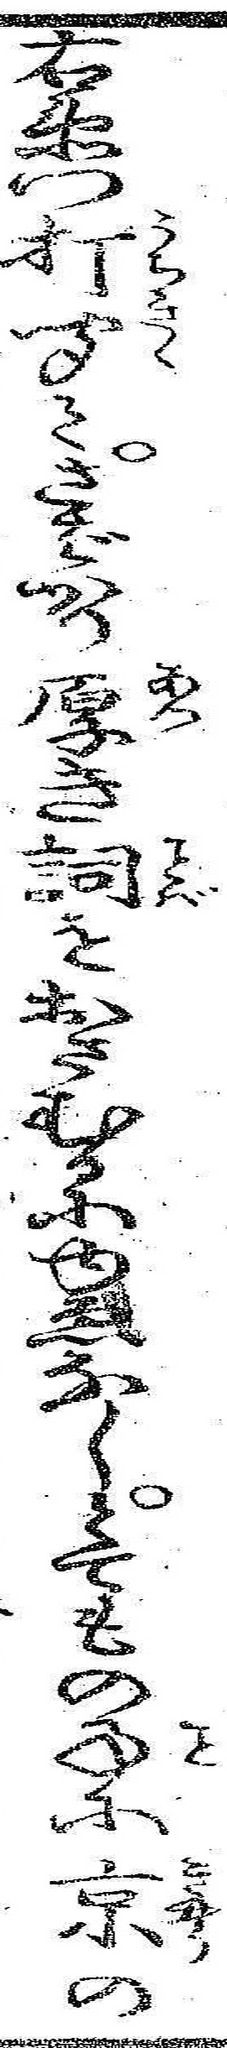右衛門打聞て。さばかり厚き詞をおさむるにゆゑなし。とてもの事に京の
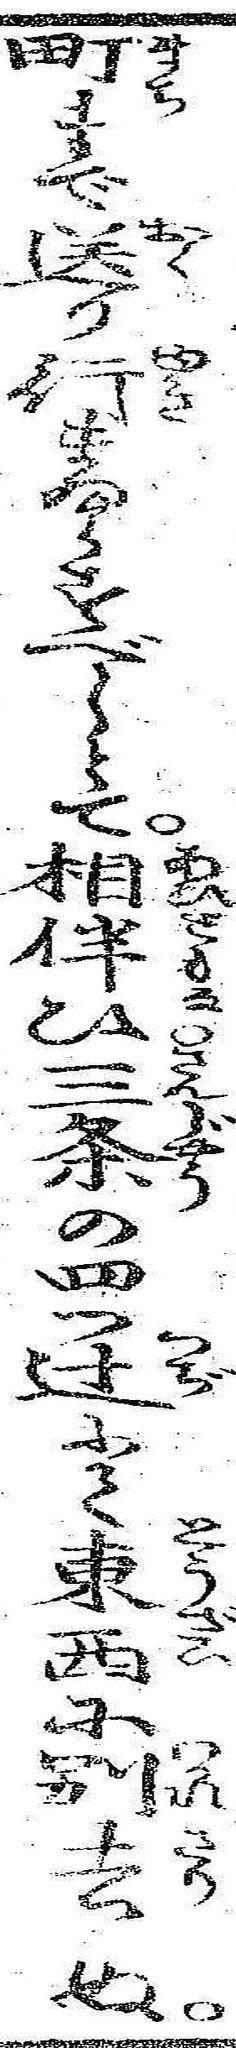町まで送り行まゐらすべしとて。相伴ひ。三条の四ツ辻にて東西に別去ぬ。
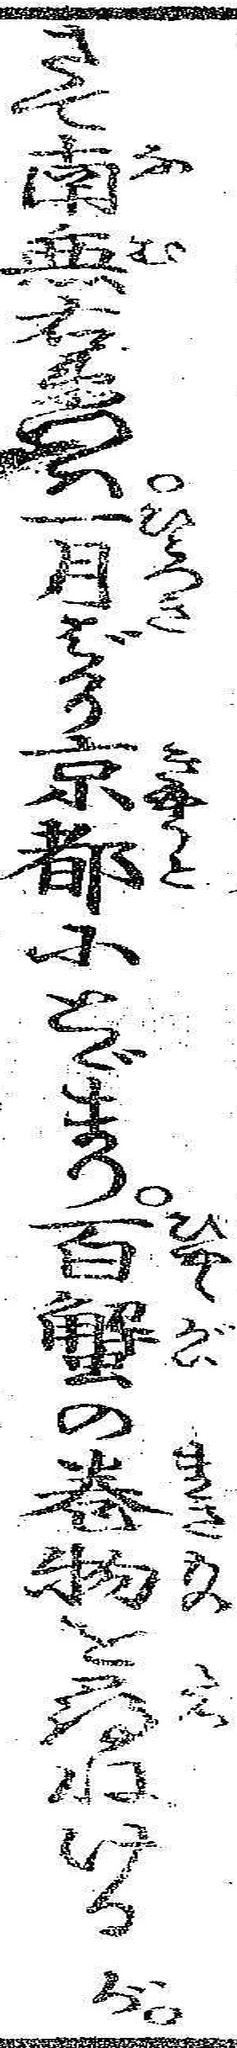さて南無右衛門は。一月ばかり京都にとゞまり。百蟹の巻物を尋ねけるが。
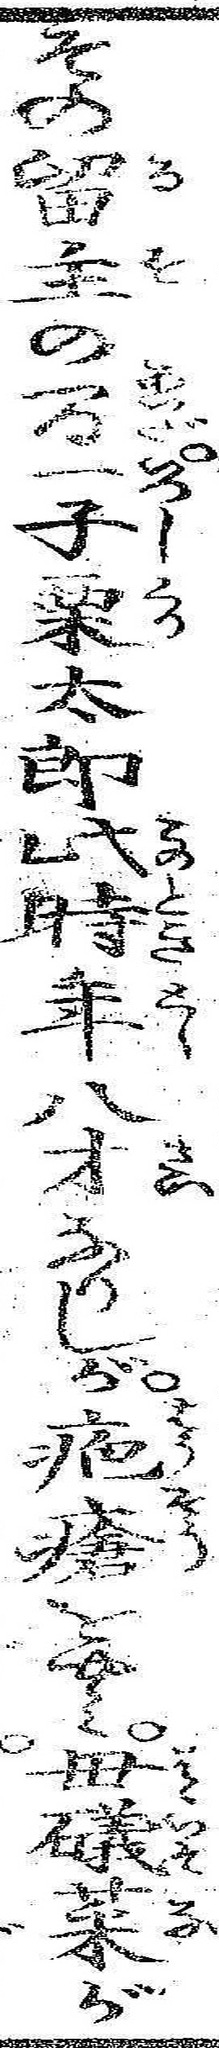その留主の間。一子栗太郎此時年八才なりしが疱瘡をやみ。母礒莱が
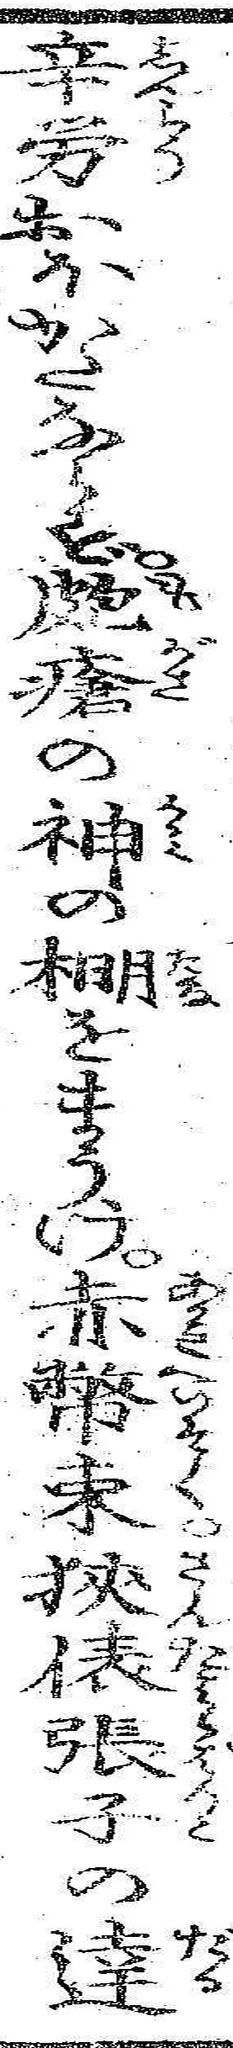辛労おほかたならず。皰瘡の神の棚をまうけ。赤幣束。狭俵。張子の達
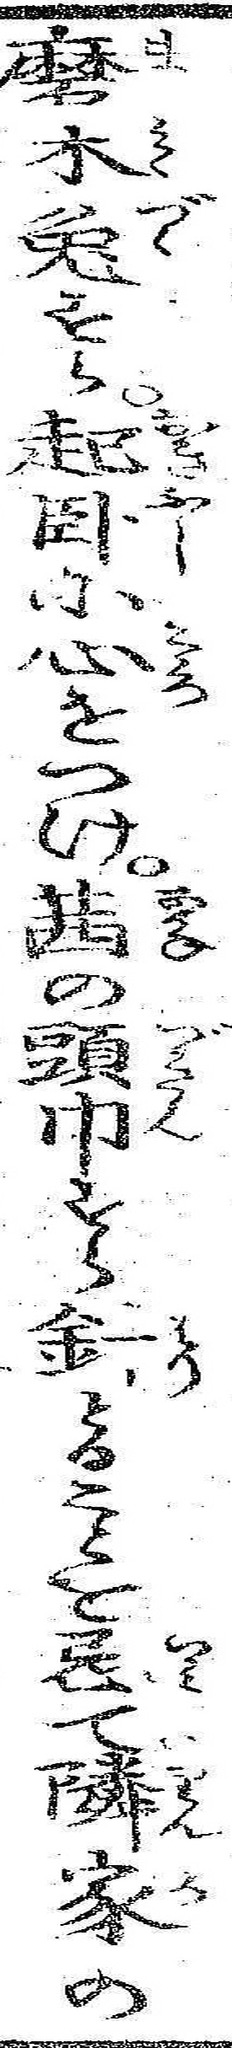磨木兎すら。起臥に心をつけ。茜の頭巾すら針とることを忌て。隣家の
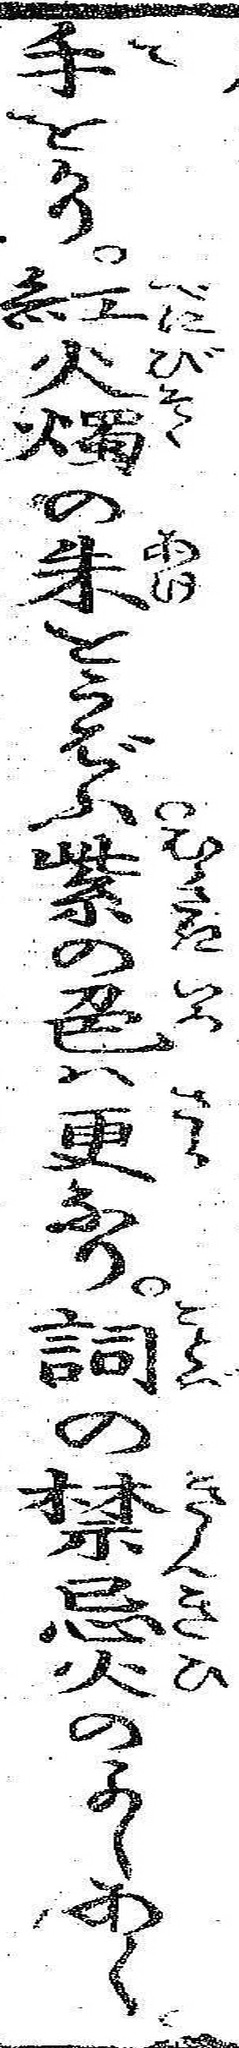手をかり。紅火燭の朱をうばふ。紫の色は更なり。詞の禁忌火のよしあし。
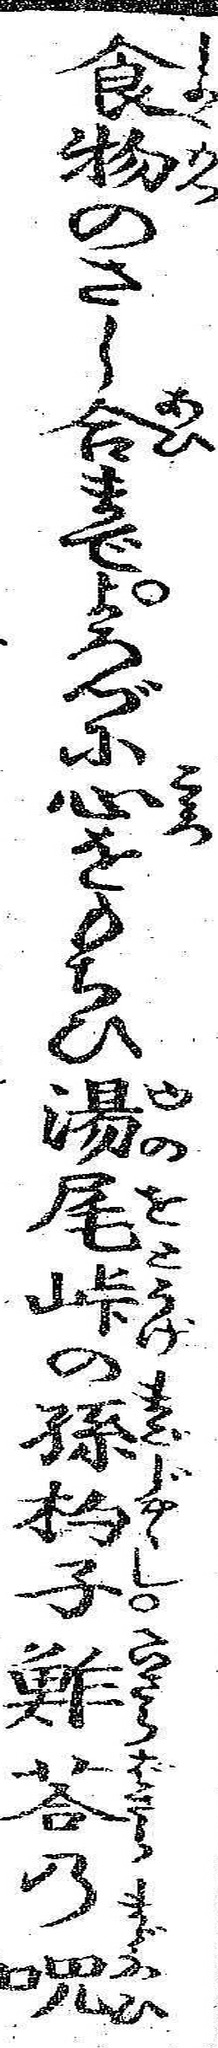食物のさし合まで。よろづに心をもちひ湯尾峠の孫杓子。鮓荅の呪
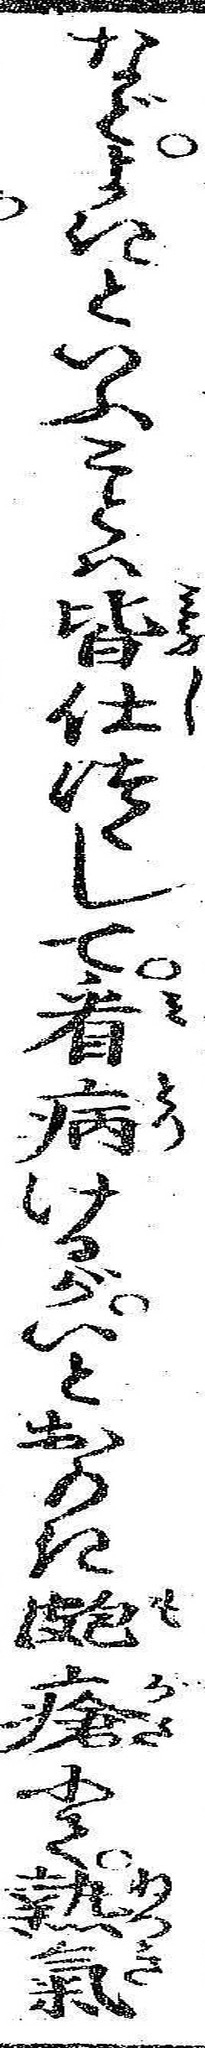など。よきといふことは皆仕つくして。看病けるが。いとおもき皰瘡にて。熱気
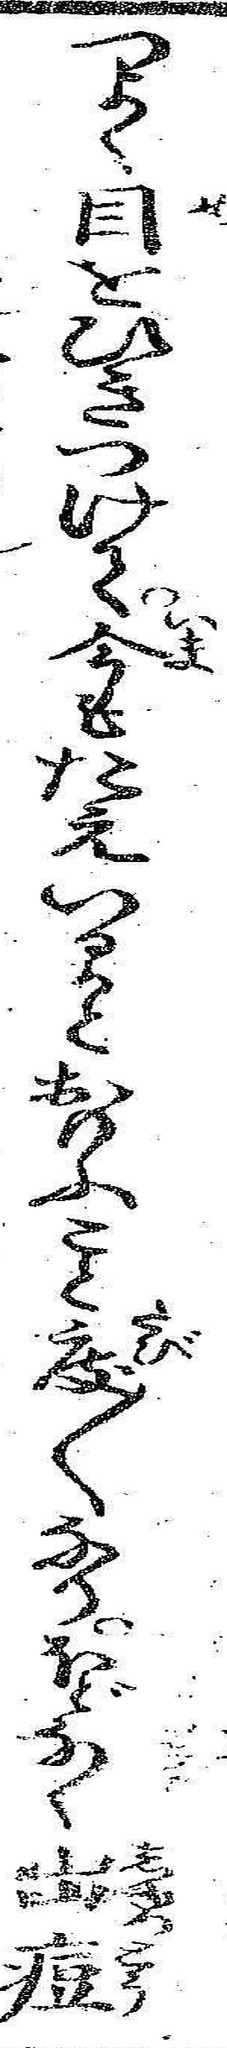つよく目をひきつけて。今もたえいるかとおもふこと度〳〵なり。ほどなく出痘
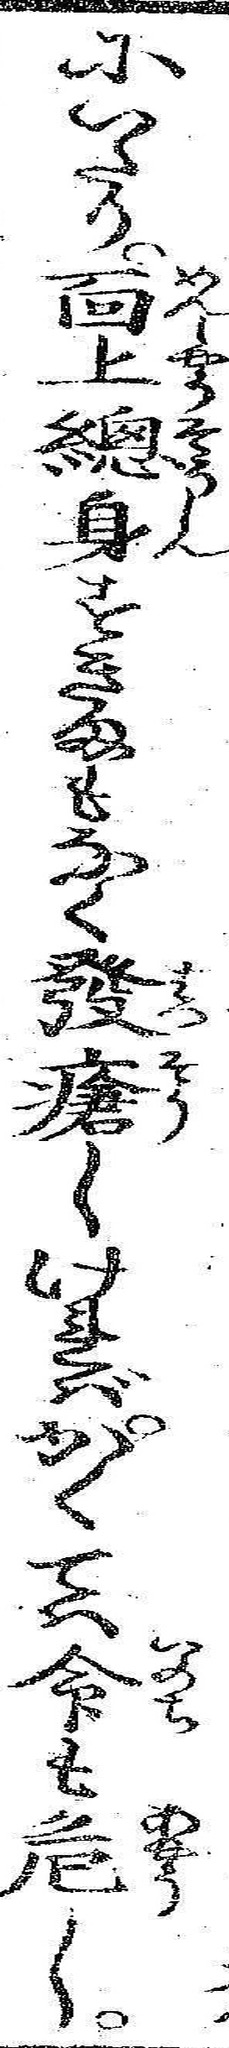にいたり。面上総身すきまもなく発瘡しければ。かくては命も危し。
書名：昔話稲妻表紙
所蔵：国文学研究資料館
